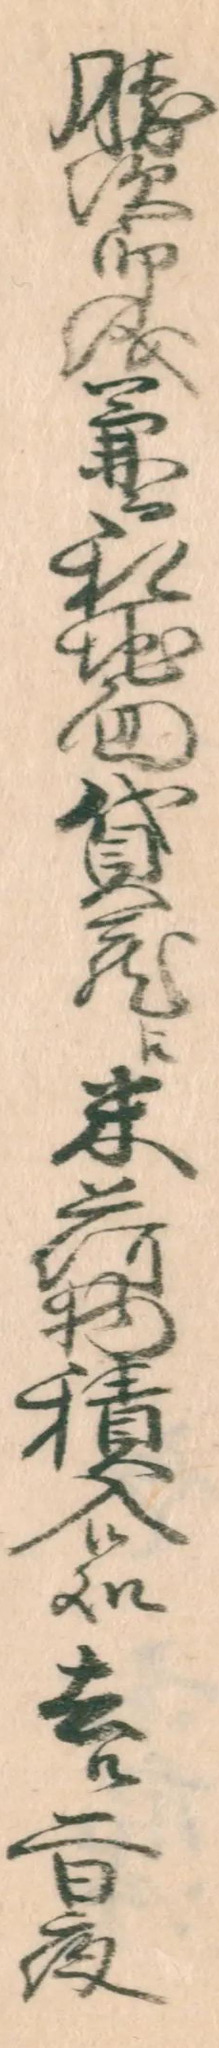勝次郎儀兼而私地面貸蔵え米荷物積入候処去ル二日夜
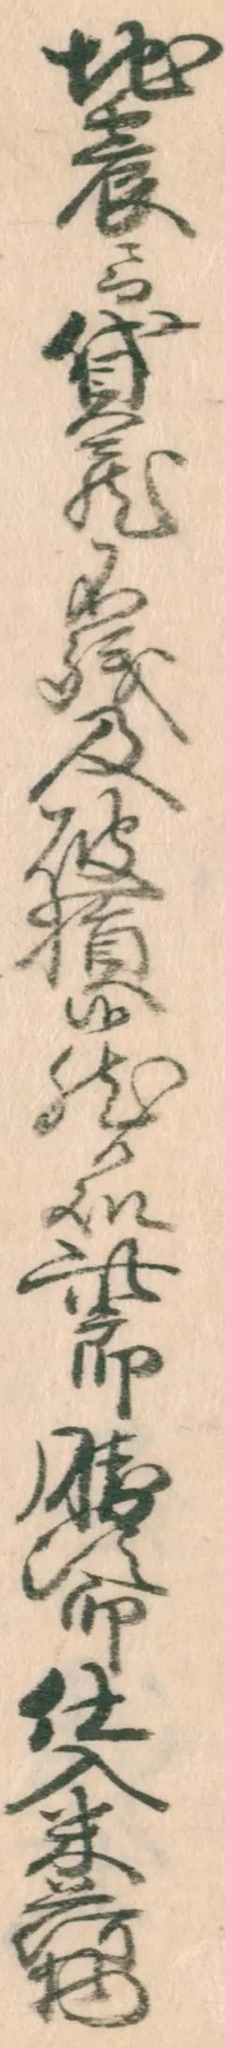地震ニ而貸蔵不残及破損候然ル処此節勝次郎仕入米荷物
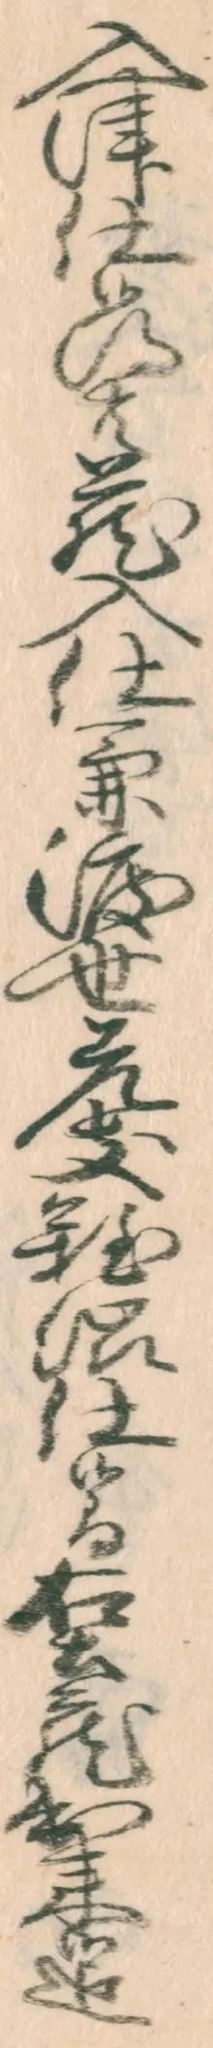入津仕候得共蔵入仕兼渡世差支難渋仕候間右土蔵出来候迄
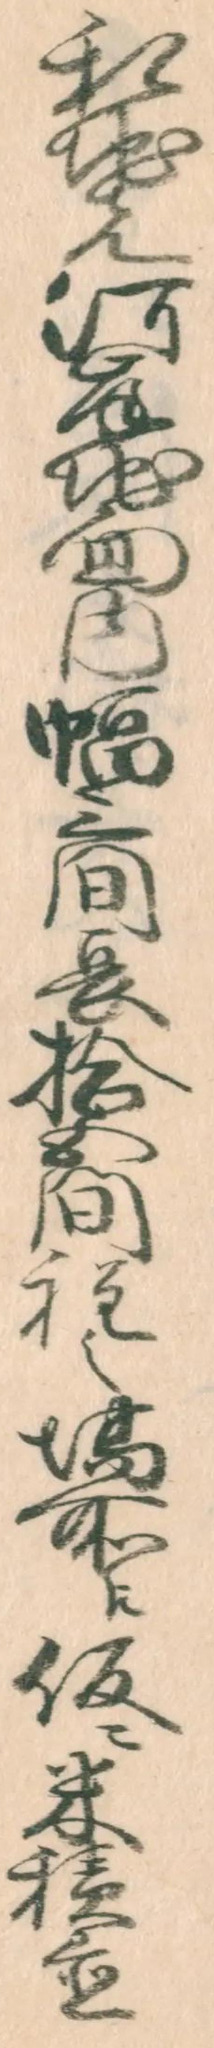私地先河岸地面内幅三間長拾五間程之場所え仮ニ米積置
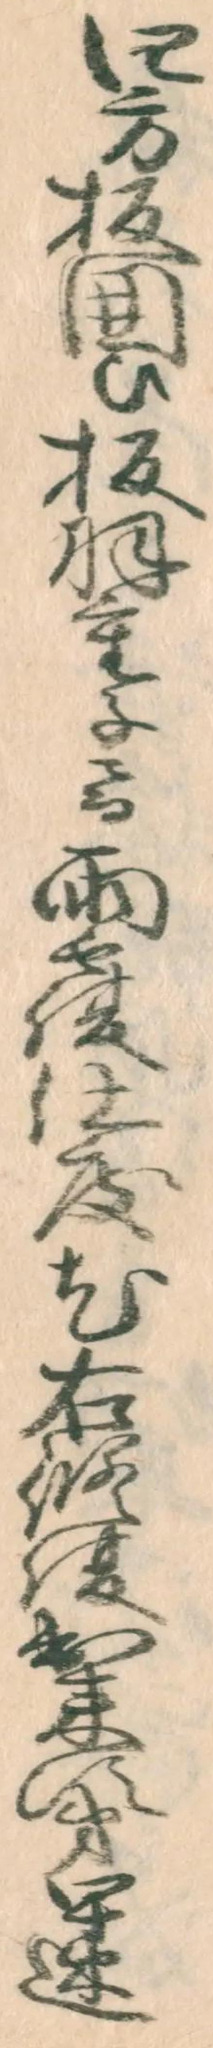四方板囲ひ板羽重子ニ而雨覆仕度尤右修復出来次第早速

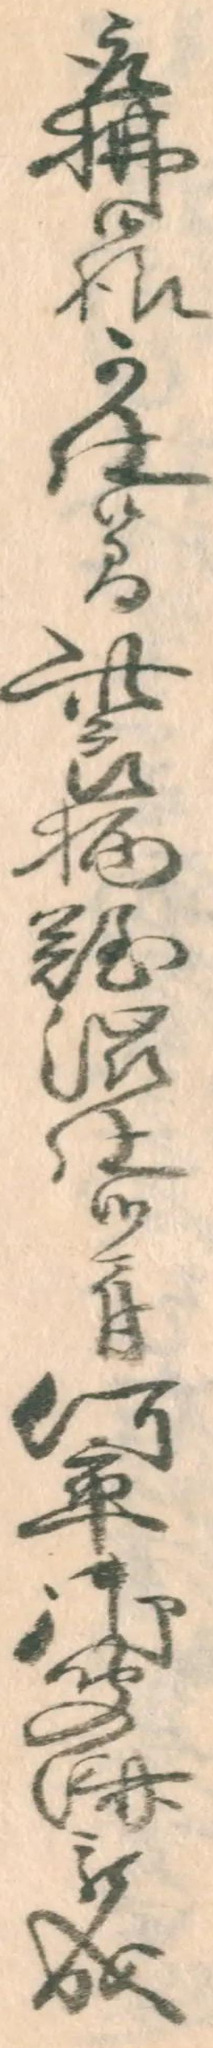取払候様可仕候間此節柄難渋仕候ニ付何卒御聞済被成
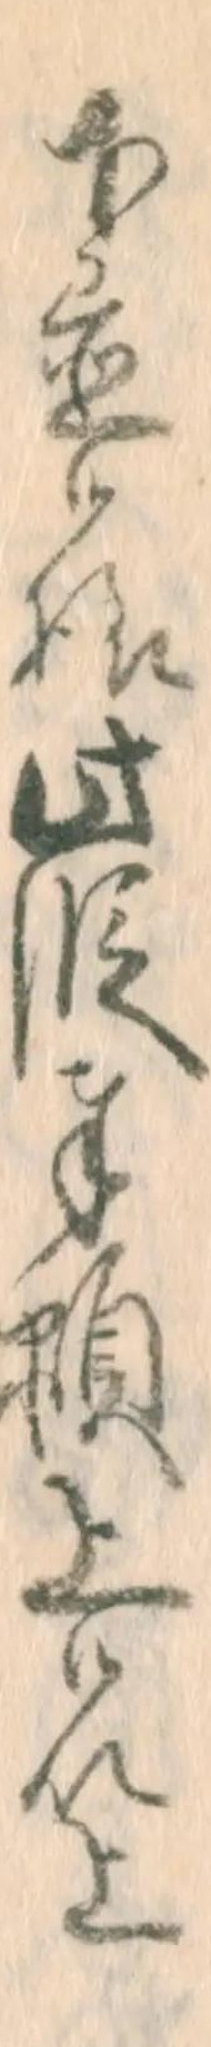下置候様此段奉願上候以上
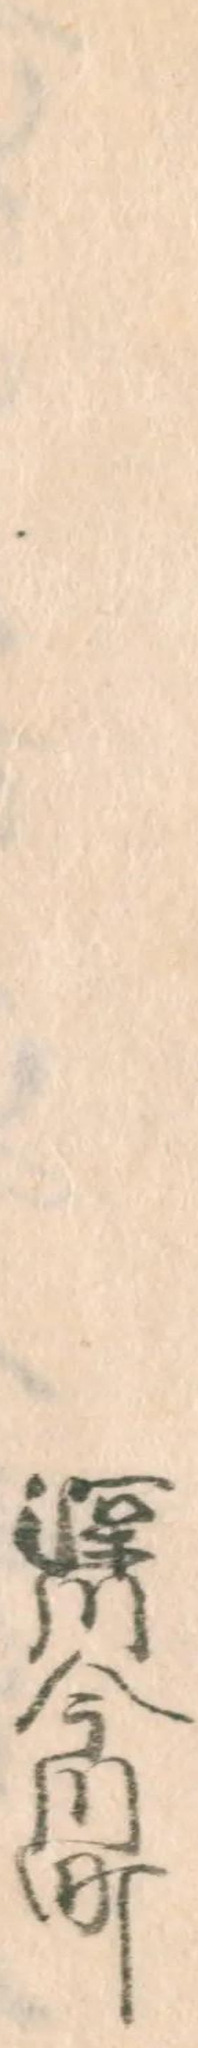深川今川町
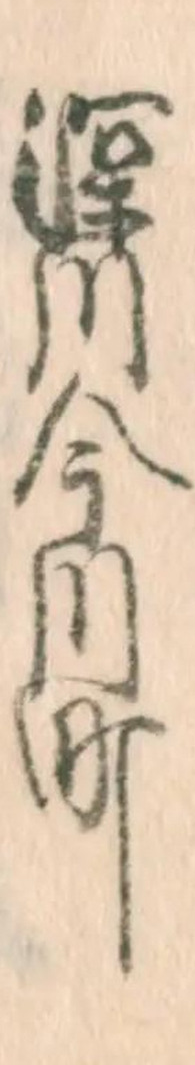深川今川町
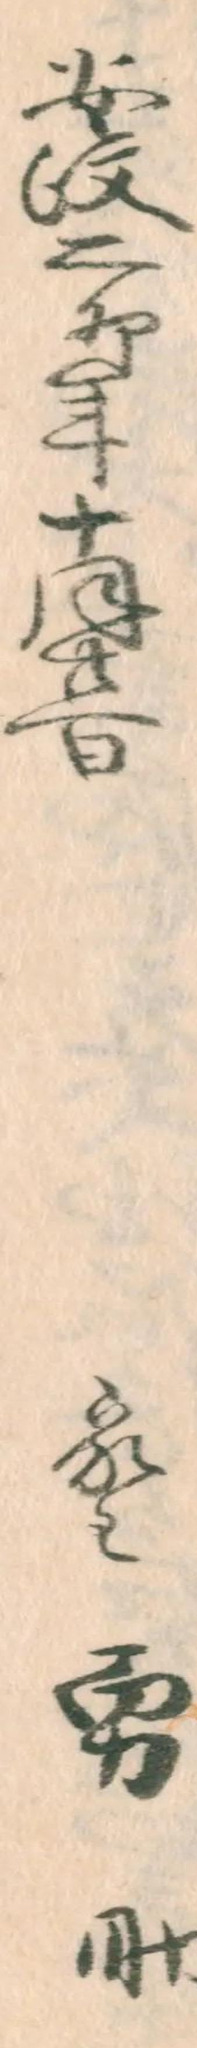安政二卯年十月廿一日家主勇助
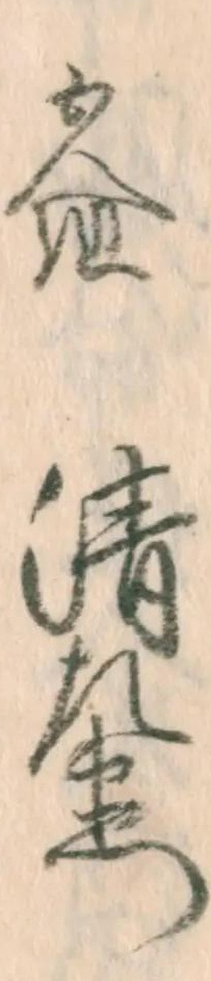五人組清左衛門
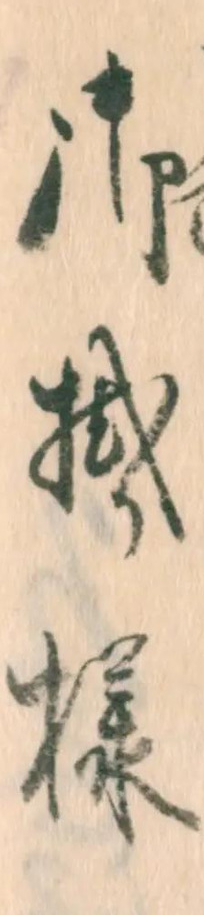御掛り様

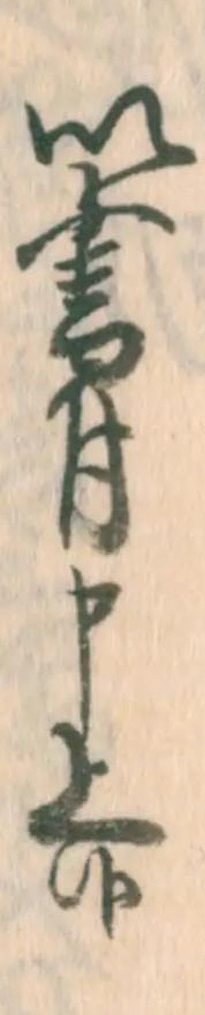以書付申上候
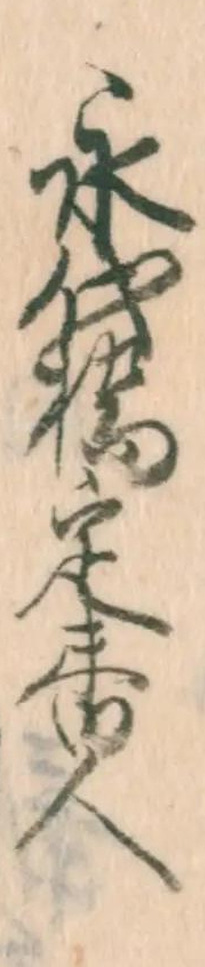永代橋定番人
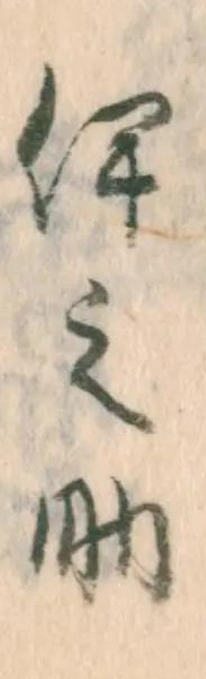伊之助
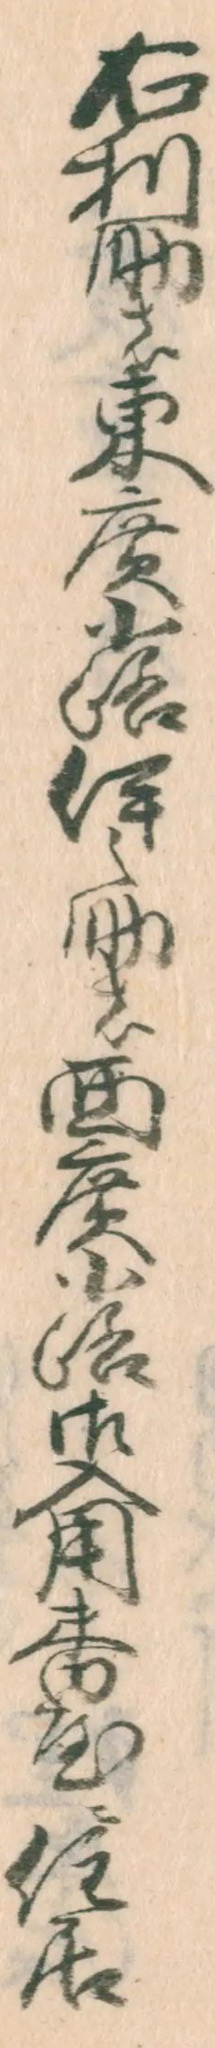右利助は東広小路伊之助は西広小路御入用番屋ニ住居
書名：地震災書留 2巻. [1] 内表紙に「地震災書留　安政二卯年　但本所深川御用屋敷地代免除調」とあり
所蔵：国立国会図書館 National Diet Library, JAPAN
